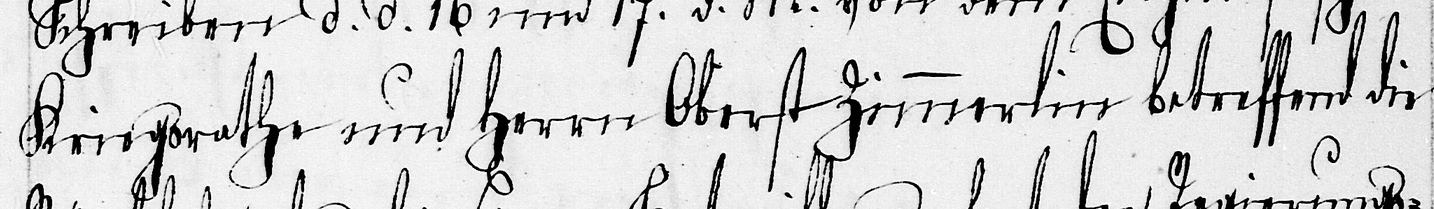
Kriegsrathe und Herrn Oberst Zimmerlin betreffend
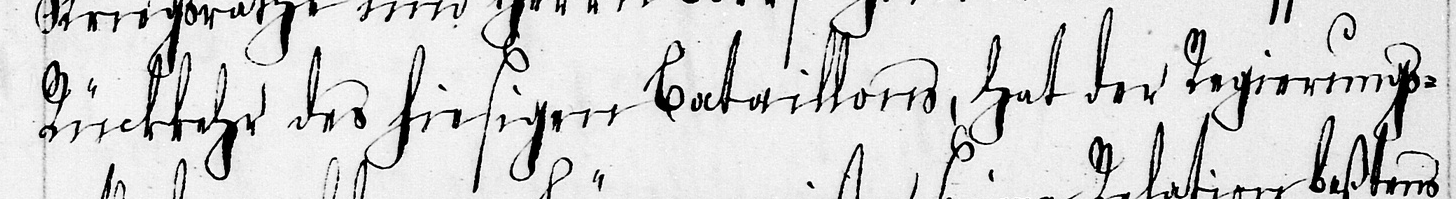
Rückkehr des hiesigen Bataillons, hat der Regierungs¬
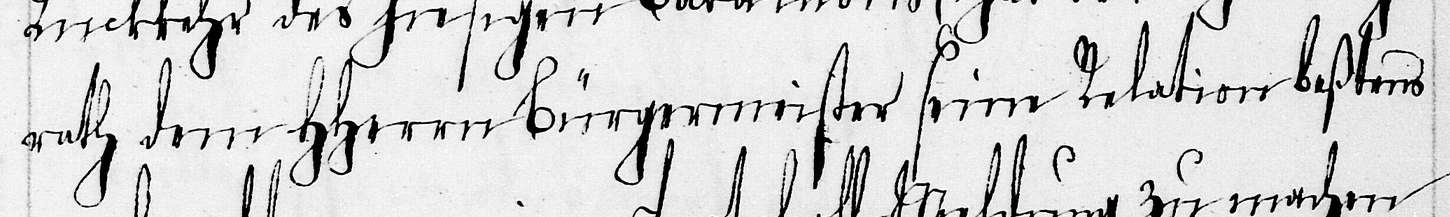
rath dem HHerrn Bürgermeister seine Relation beßtens
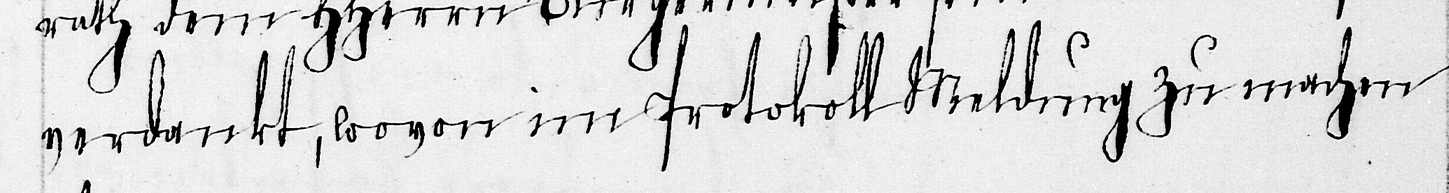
verdankt, wovon im Protokoll Meldung zu machen
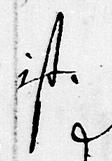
ist.
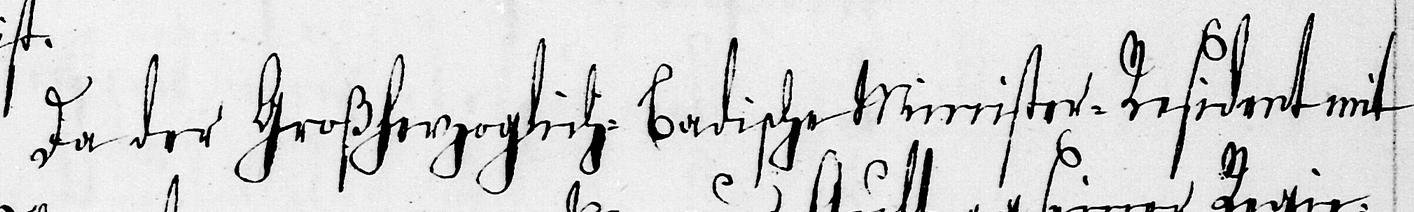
Da der Großherzoglich-Badische Minister-Resident mit
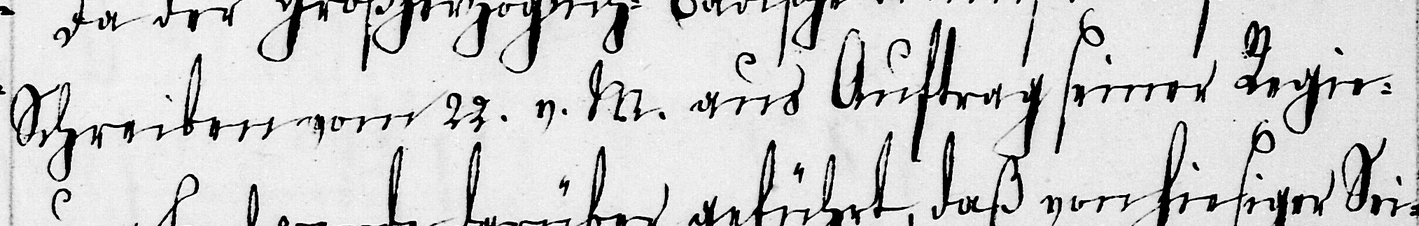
Schreiben vom 22. v. M. aus Auftrag seiner Regie¬
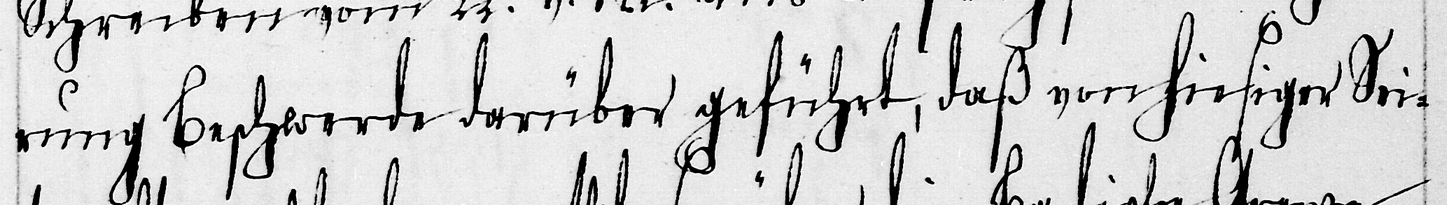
rung Beschwerde darüber geführt, daß von hiesiger Sei¬
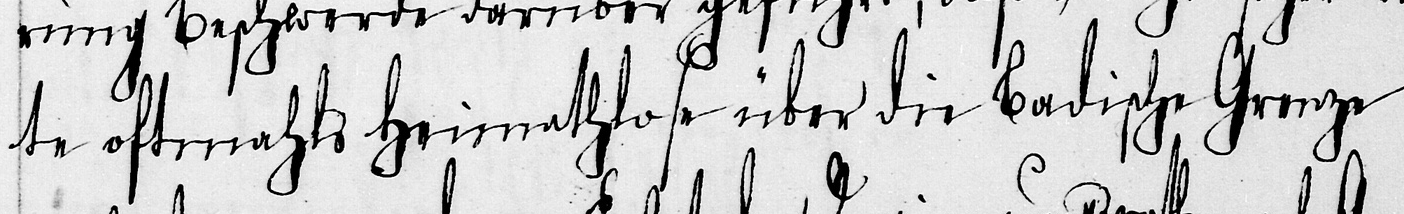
te oftmahls Heimathlose über die Badische Grenze
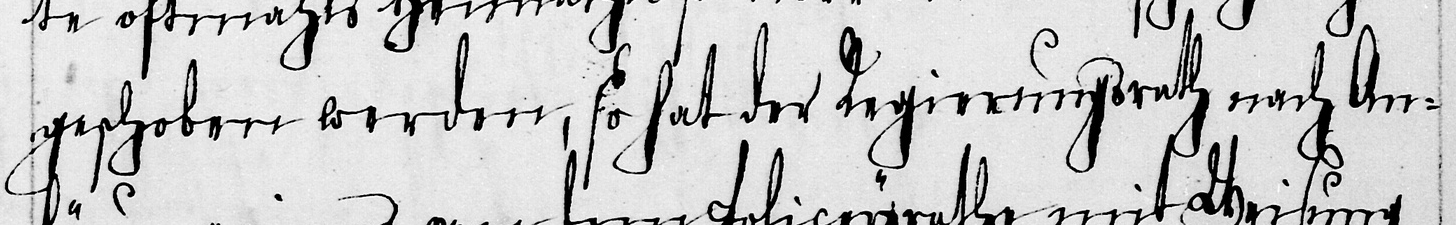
geschoben werden, so hat der Regierungsrath nach An¬
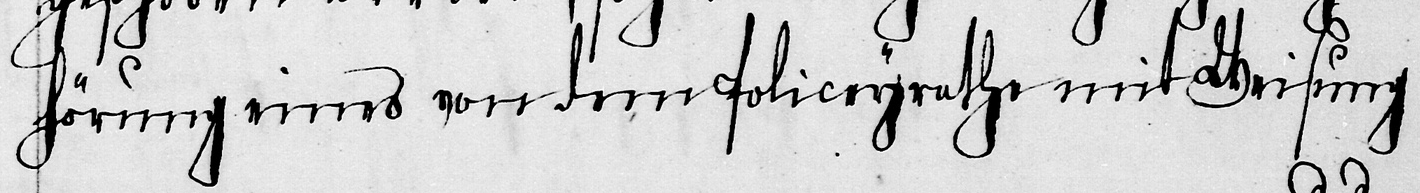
hörung eines von dem Policeyrathe mit Weisung
